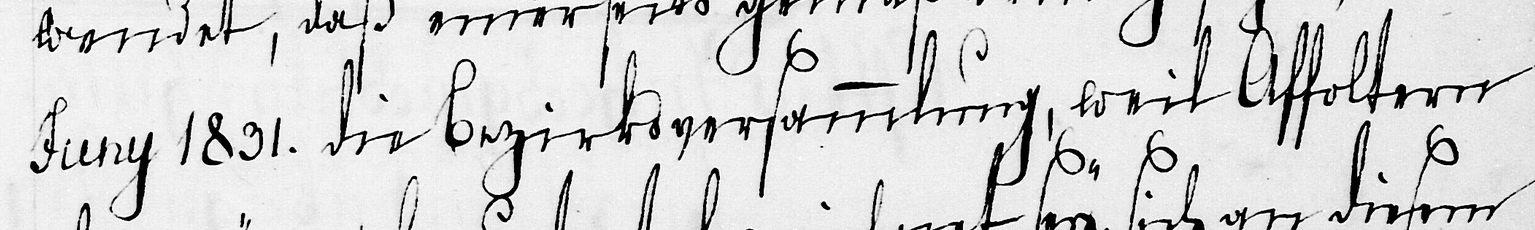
Juny 1831. die Bezirksversammlung, weil Affoltern
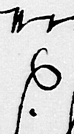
l¬
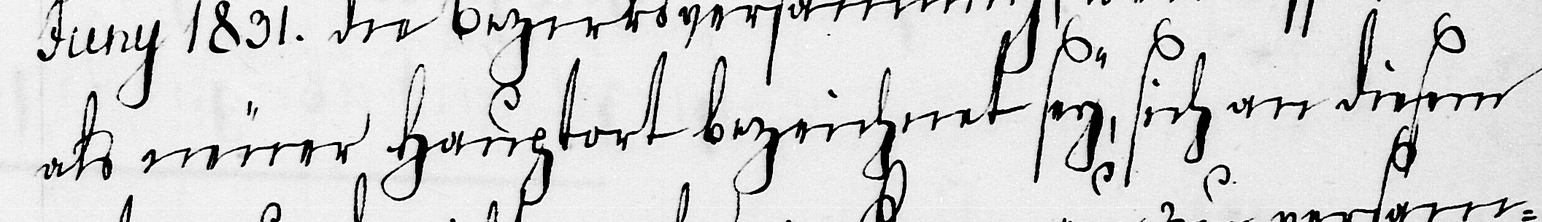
als neuer Hauptort bezeichnet sey, sich an diesem
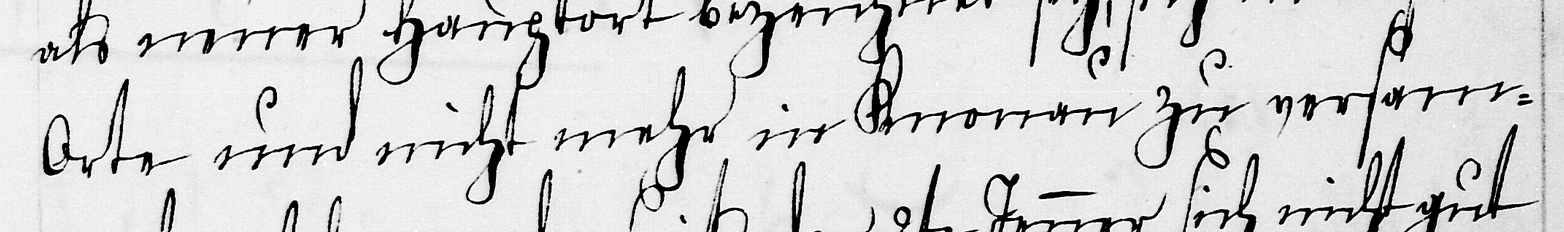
Orte und nicht mehr in Knonau zu versam¬
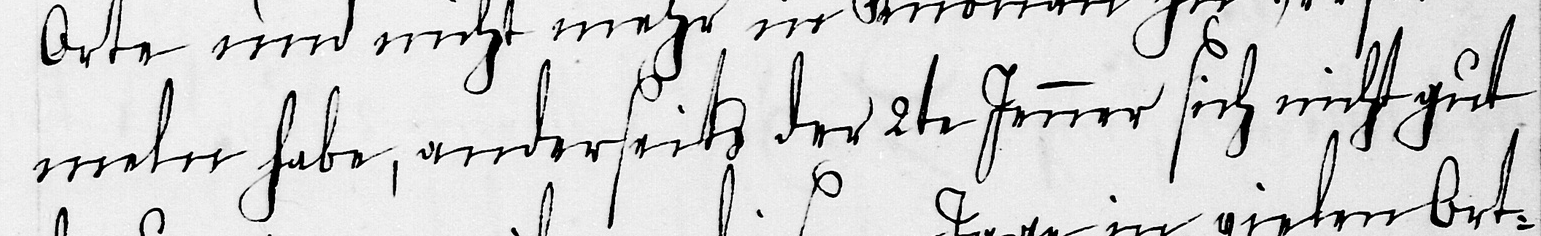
meln habe, anderseits der 2te Jenner sich nicht gut
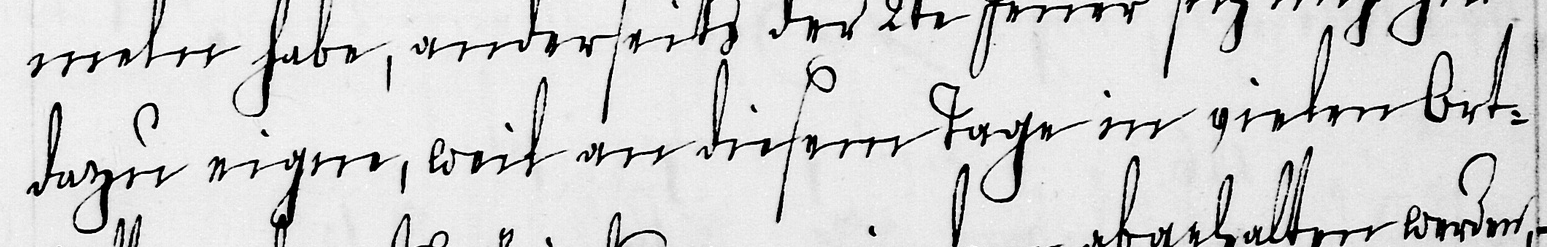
dazu eigne, weil an diesem Tage in vielen Ort¬
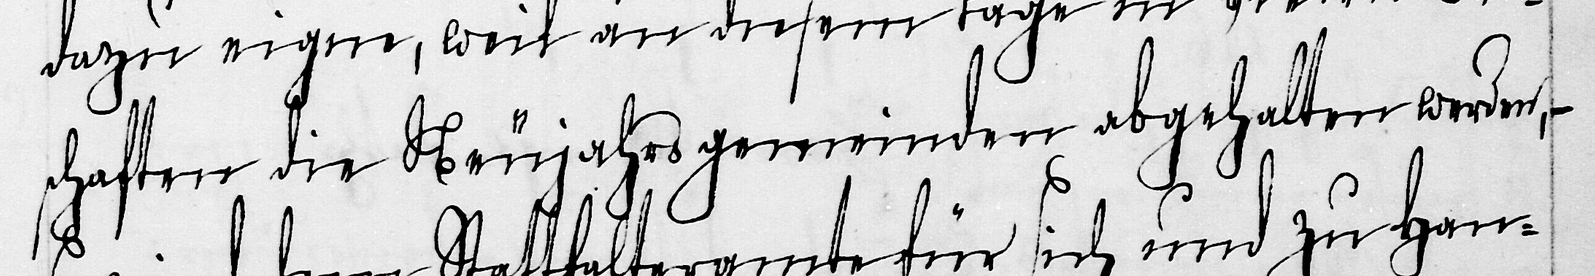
schaften die Neujahrsgemeinden abgehalten werden,
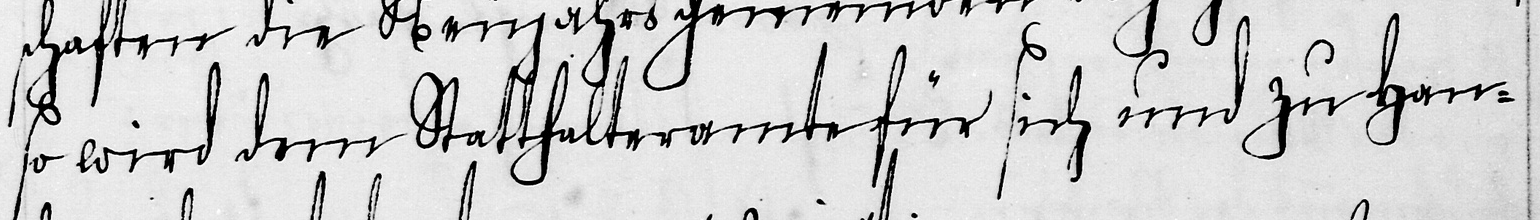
so wird dem Statthalteramte für sich und zu Han¬
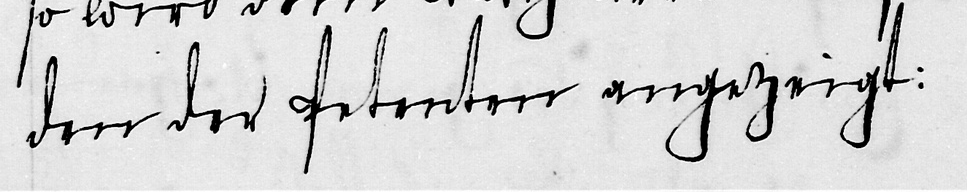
den der Petenten angezeigt:
